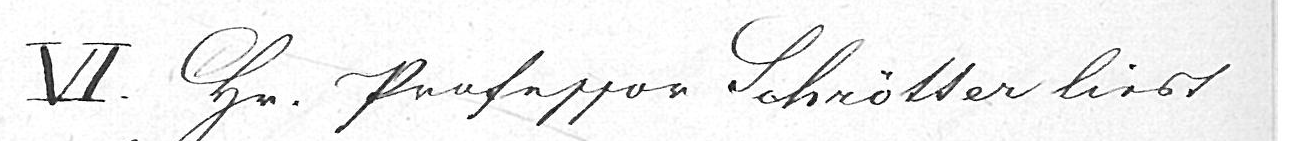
VI. Hr. Professor Schrötter liest
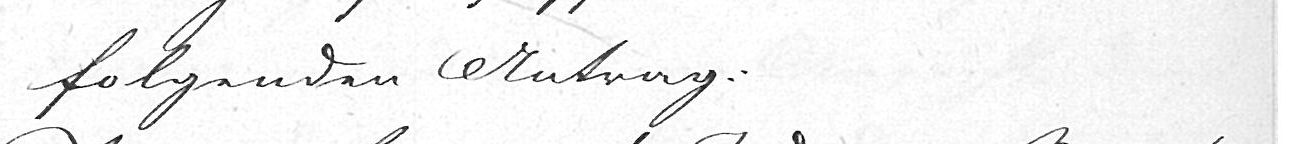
folgenden Antrag.
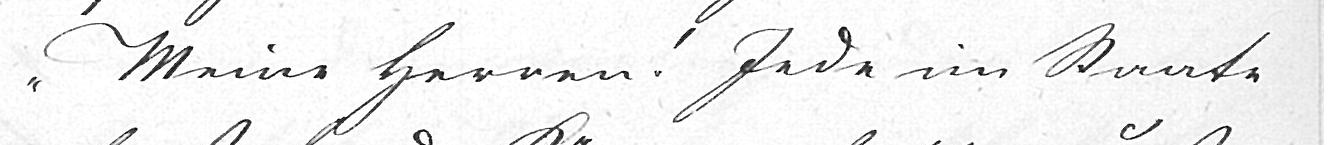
" Meine Herren! Jede im Staate
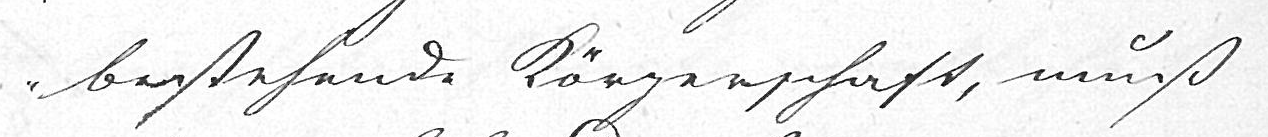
" bestehende Körperschaft, muß
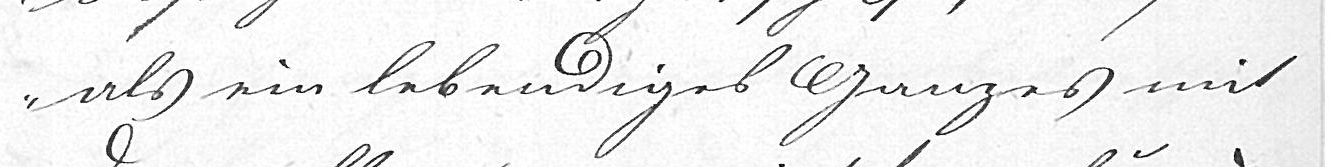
" als ein lebendiges Ganzes mit
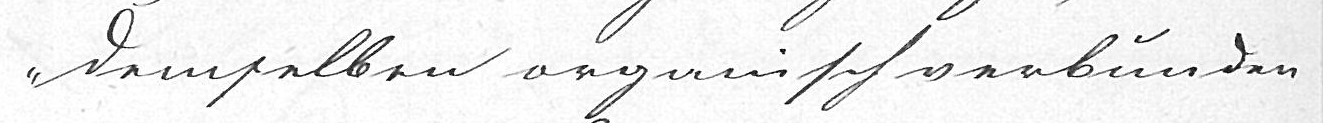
" demselben organisch verbunden
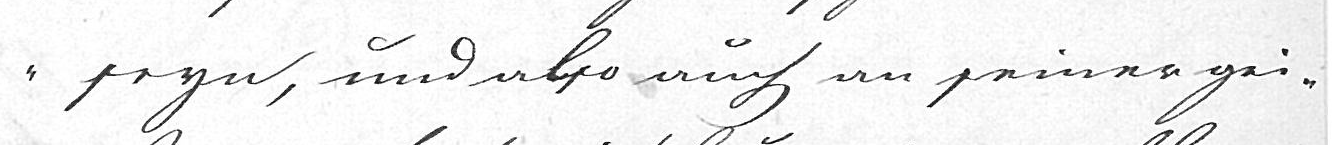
" seyn, und also auch an seiner gei-
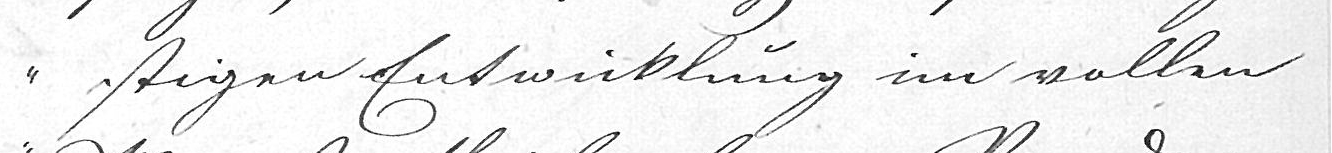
" stigen Entwicklung im vollen
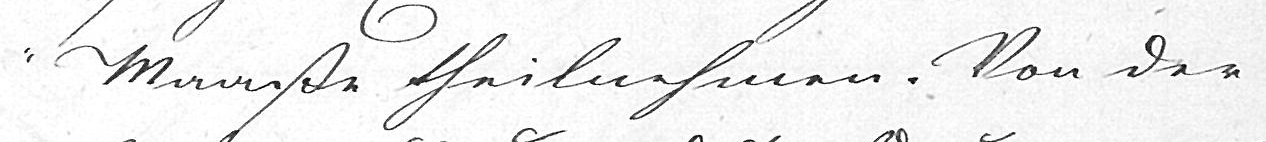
" Maaße theilnehmen. Von der
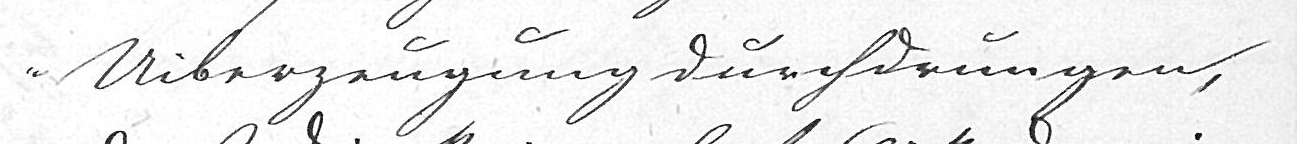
" Uiberzeugung durchdrungen
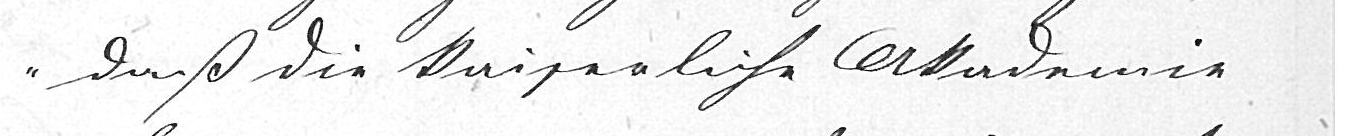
" daß die kaiserliche Akademie
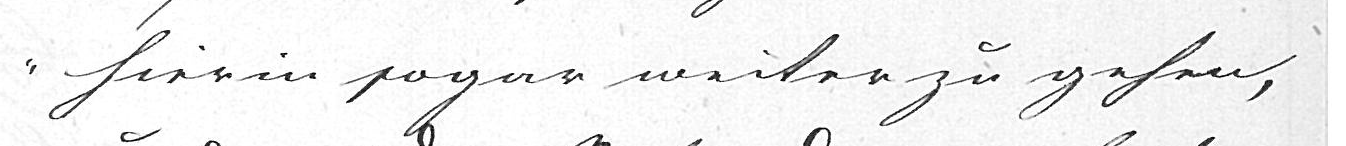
" hierin sogar weiter zu gehen
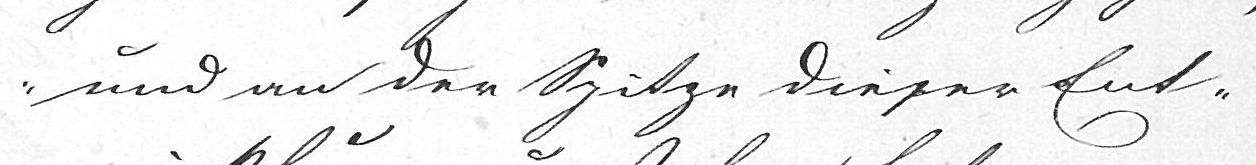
" und an der Spitze dieser Ent-
